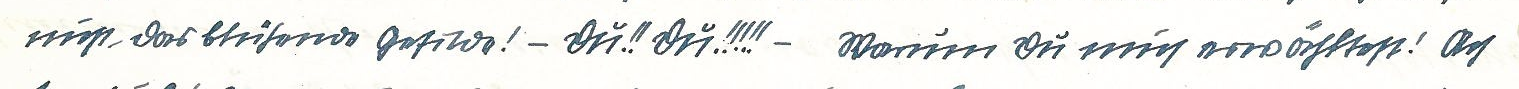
nicht, das blühende Gefilde! – Du!! Du!!!!! – Warum Du mich erwähltest! Ach
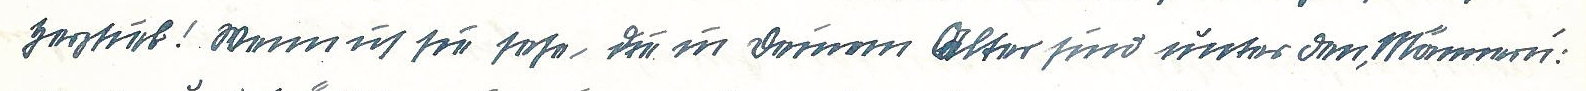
Herzlieb! Wenn ich sie sehe, die in Deinem Alter sind unter den ‚Männern‘:
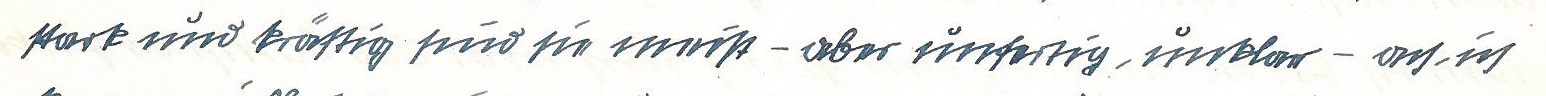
stark und kräftig sind sie meist – aber unfertig, unklar – ach, ich
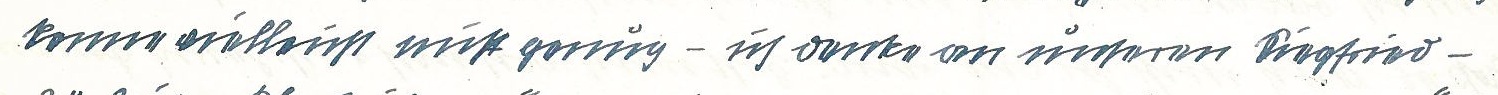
kenne vielleicht nicht genug – ich denke an unseren Siegfried –
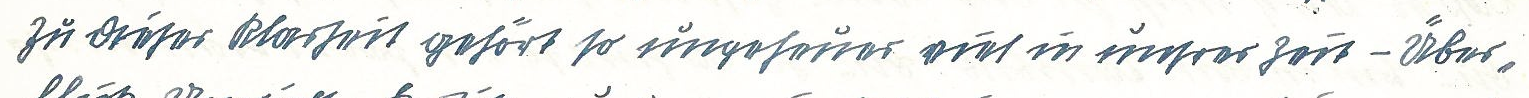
zu dieser Klarheit gehört so ungeheuer viel in unsrer Zeit – Über¬
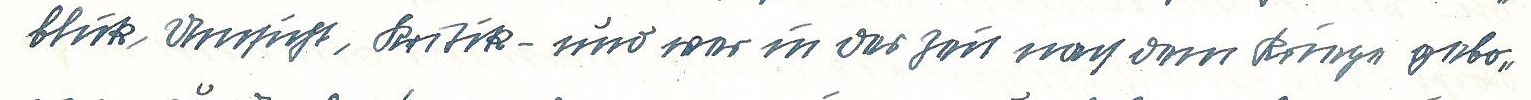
blick, Umsicht, Kritik – und wer in der Zeit nach dem Kriege gebo¬
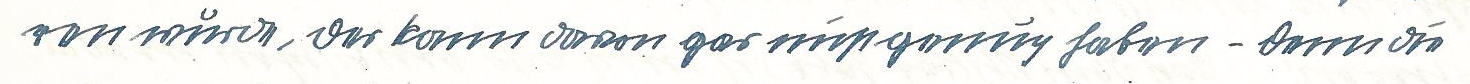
ren wurde, der kann davon gar nicht genug haben – denn die
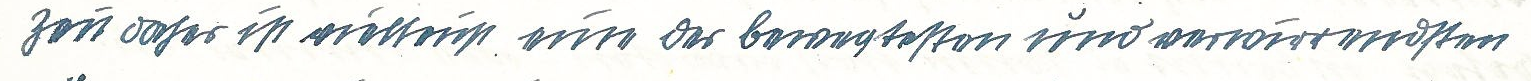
Zeit daher ist vielleicht eine der bewegtesten und verwirrensten
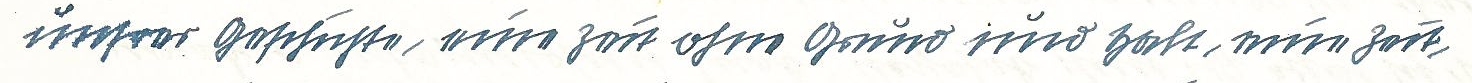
unsrer Geschichte, eine Zeit ohne Grund und Halt, eine Zeit,
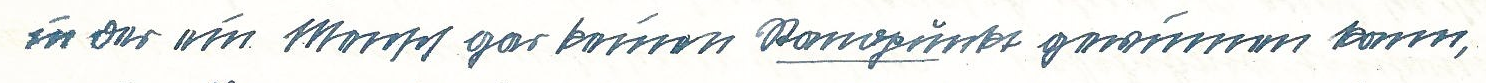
in der ein Mensch gar keinen Standpunkt gewinnen kann,
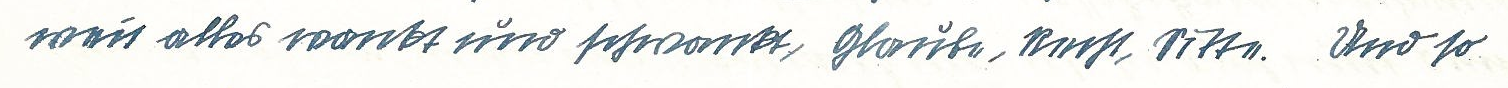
weil alles wankt und schwankt, Glaube, Recht, Sitte. Und so
